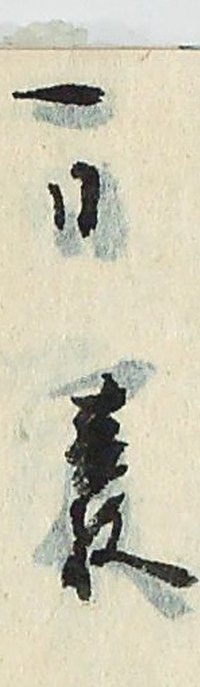一同壱枚同
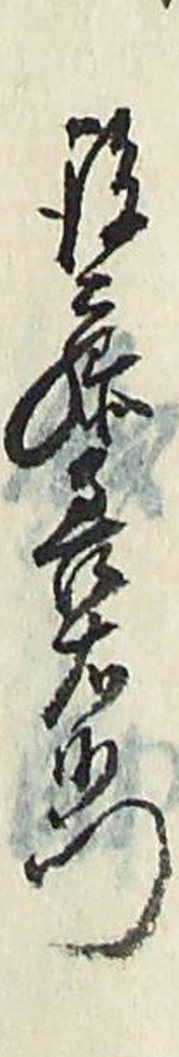後藤善右衛門
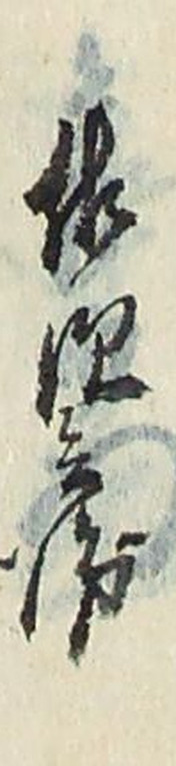佐次兵衛
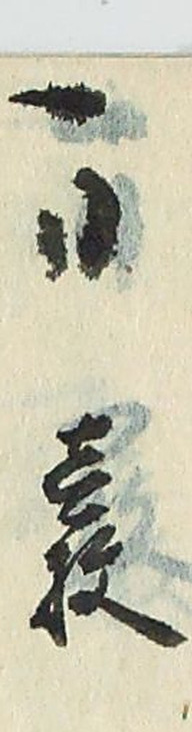一同壱枚同
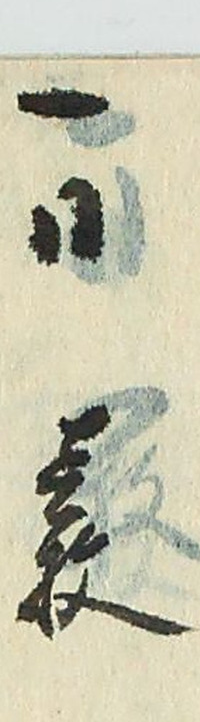一同壱枚同
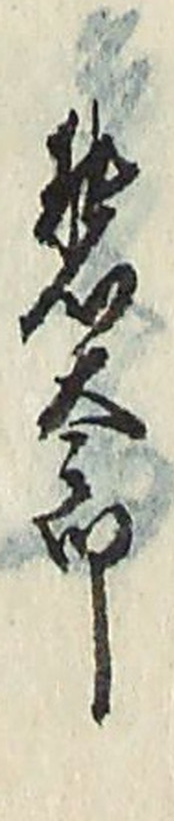熊太郎
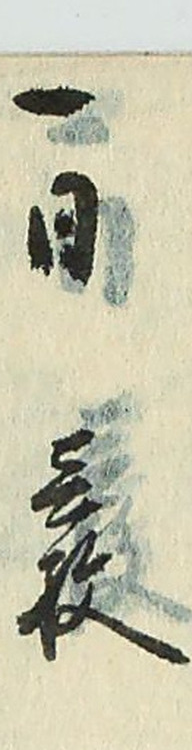一同壱枚同
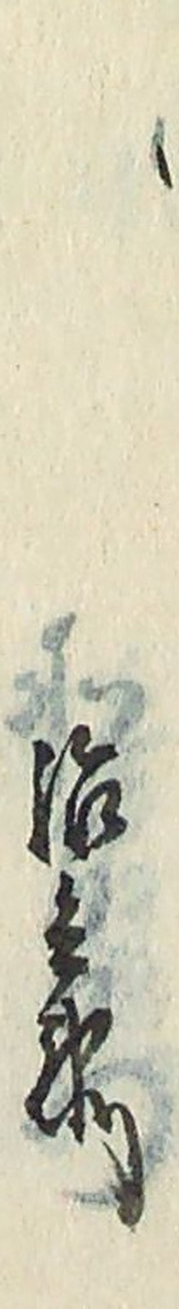治兵衛
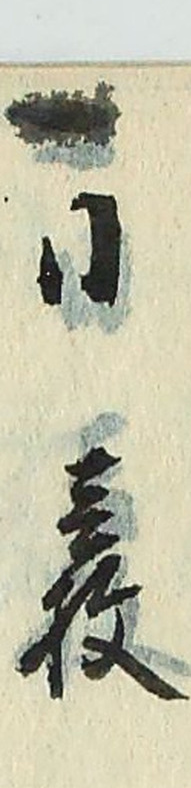一同壱枚同
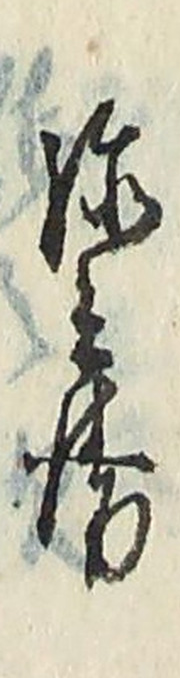弥兵衛
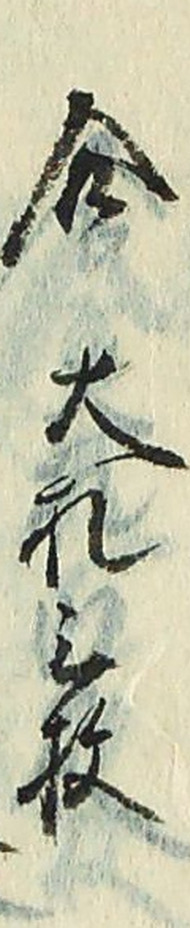合大札三枚
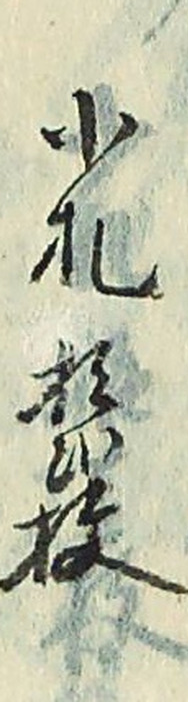小札拾弐枚
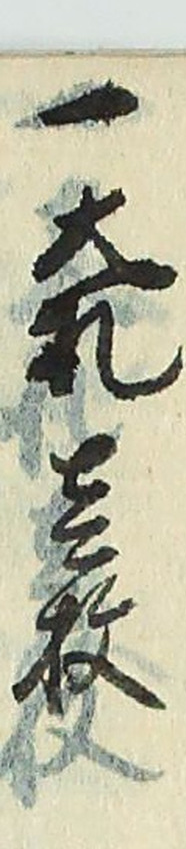一小札壱枚同
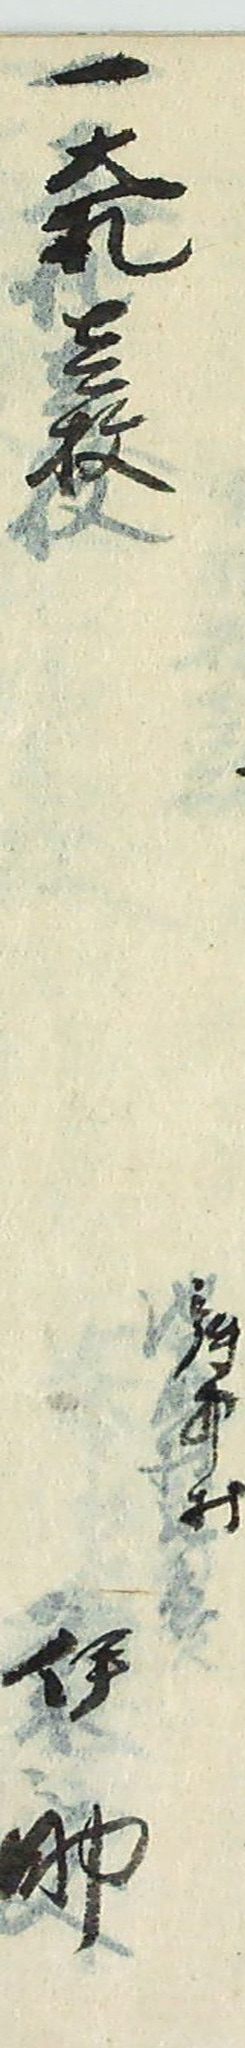一大札壱枚府中村
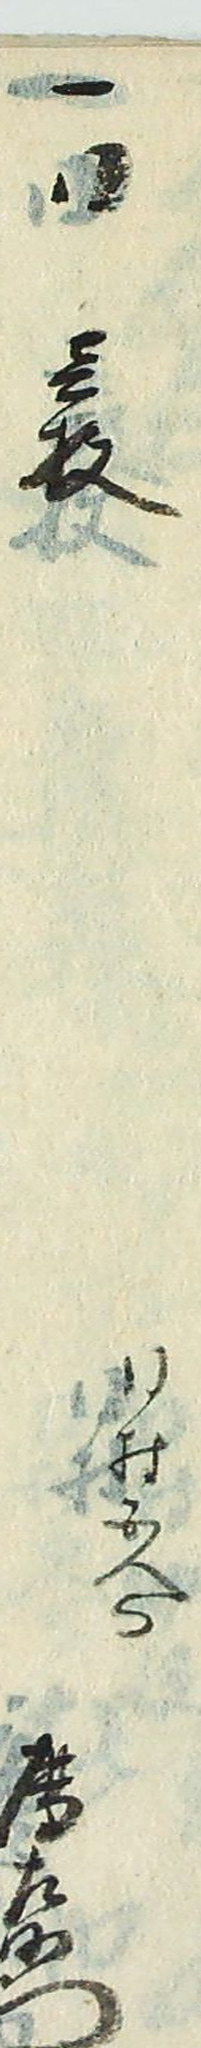一同壱枚同村五人与
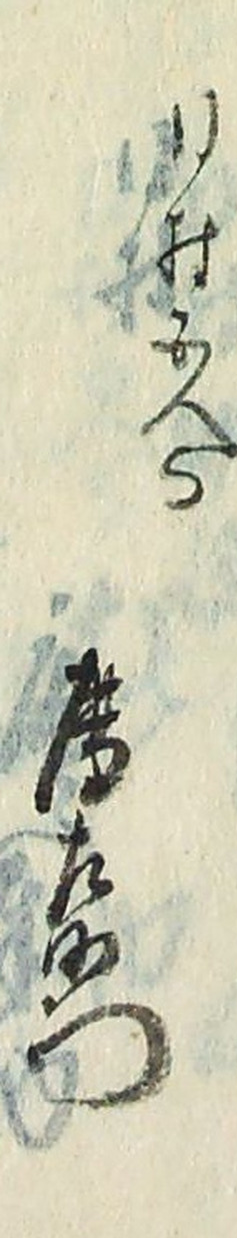鹿左衛門
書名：諸御用御□受書控
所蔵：鳴門教育大学 Naruto University of Education
